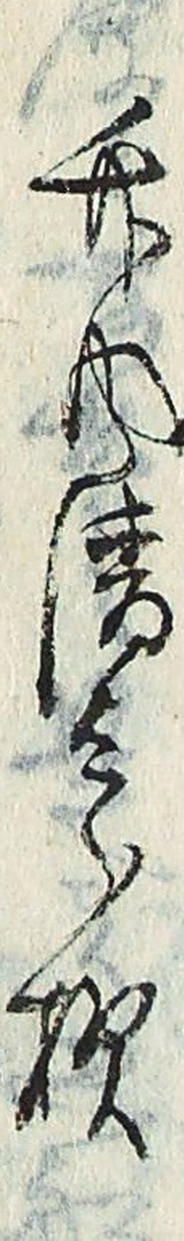竹内清太郎様
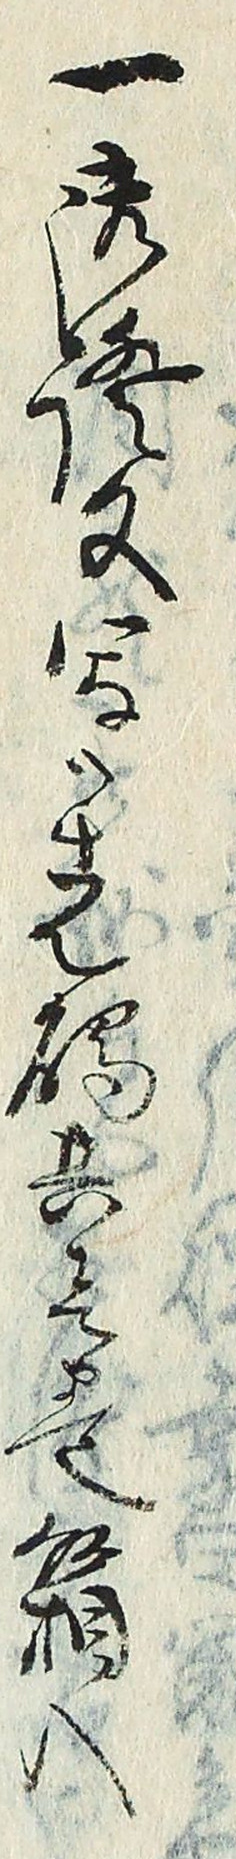一御証文写御先触共壱巻箱入
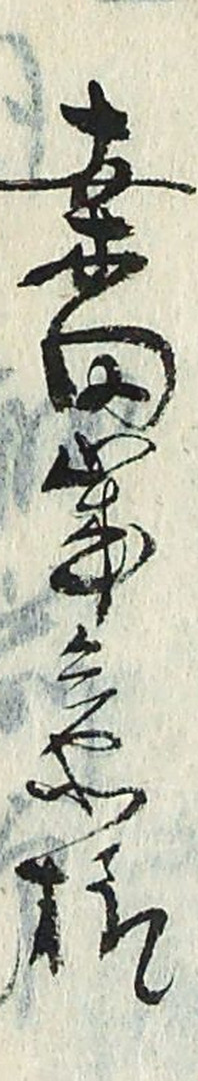桑田歳兵衛様
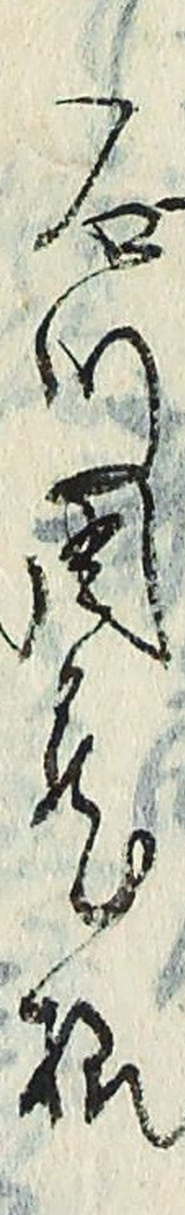石川周蔵様
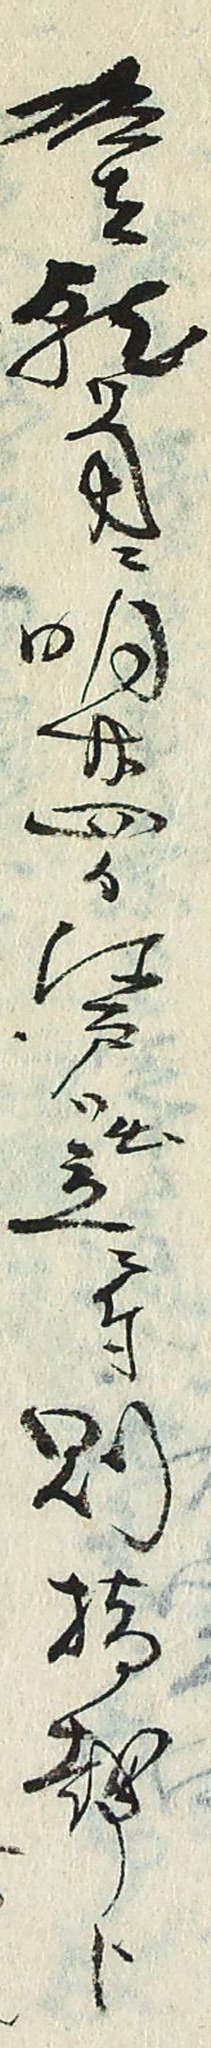右は就御用に明廿四日江戸出立に付則指越申
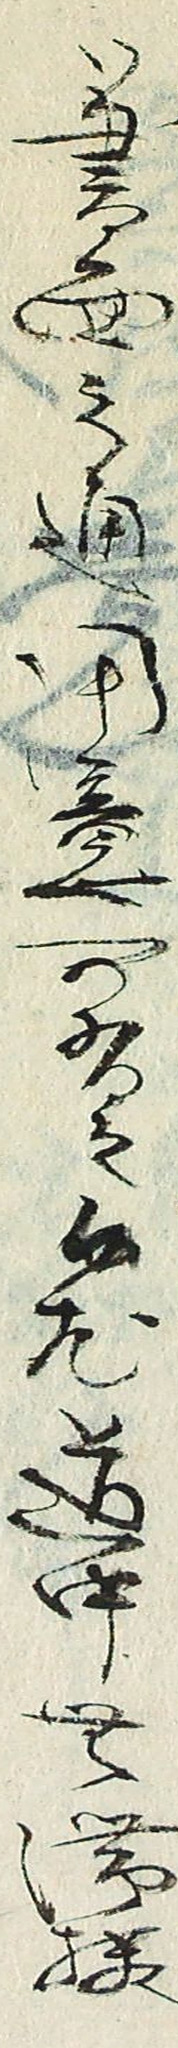御書面之通用意可有之候尤道中無滞様
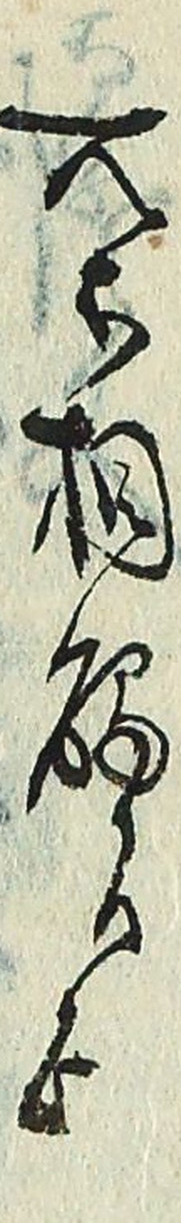可被相触候以上
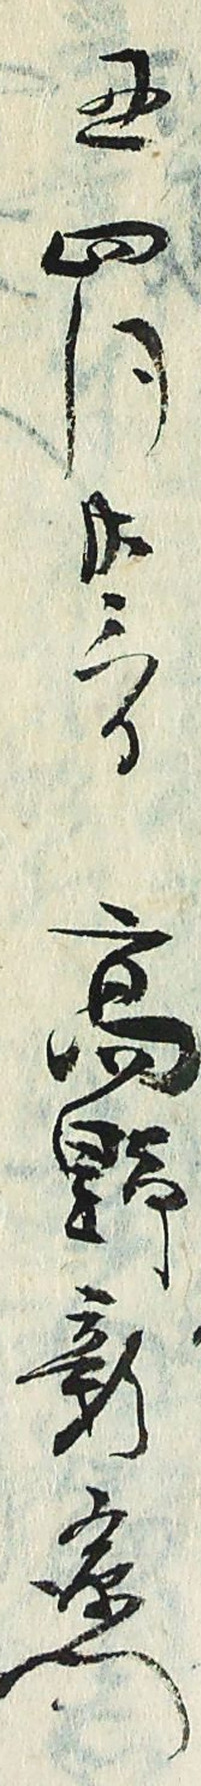丑四月廿三日高野新右衛門
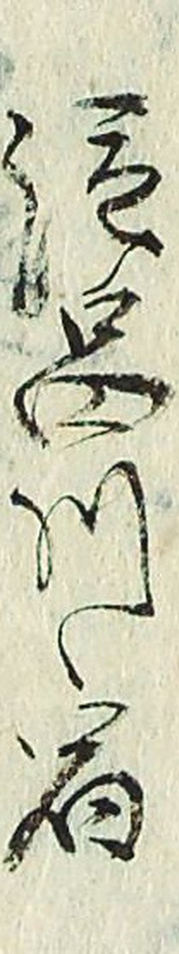従品川宿
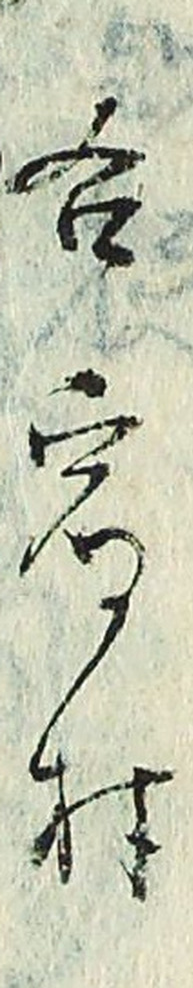各宿村
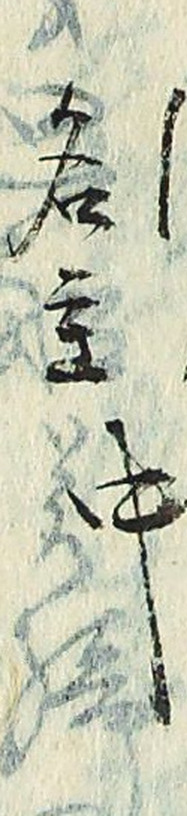名主中
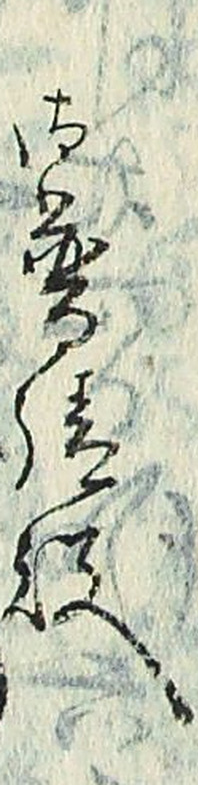御普請役
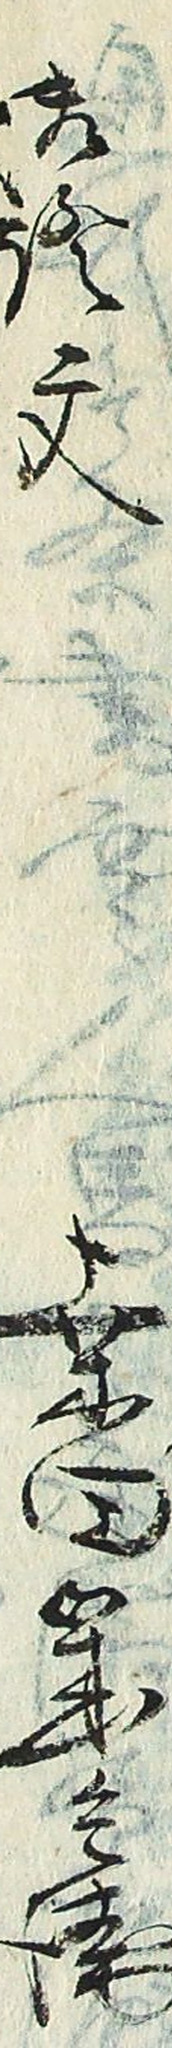御証文桑田歳兵衛
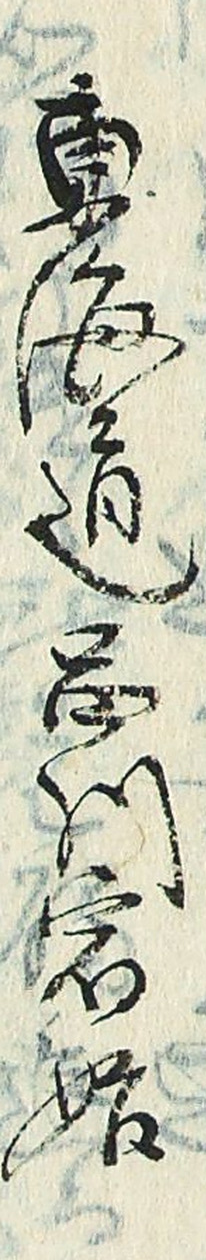東海道品川宿始

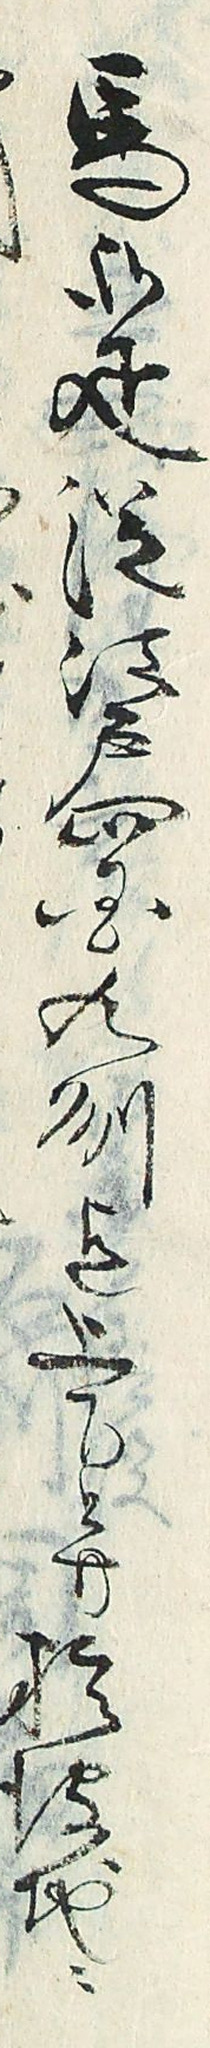馬弐疋従江戸四国九州迄上下并於彼地に
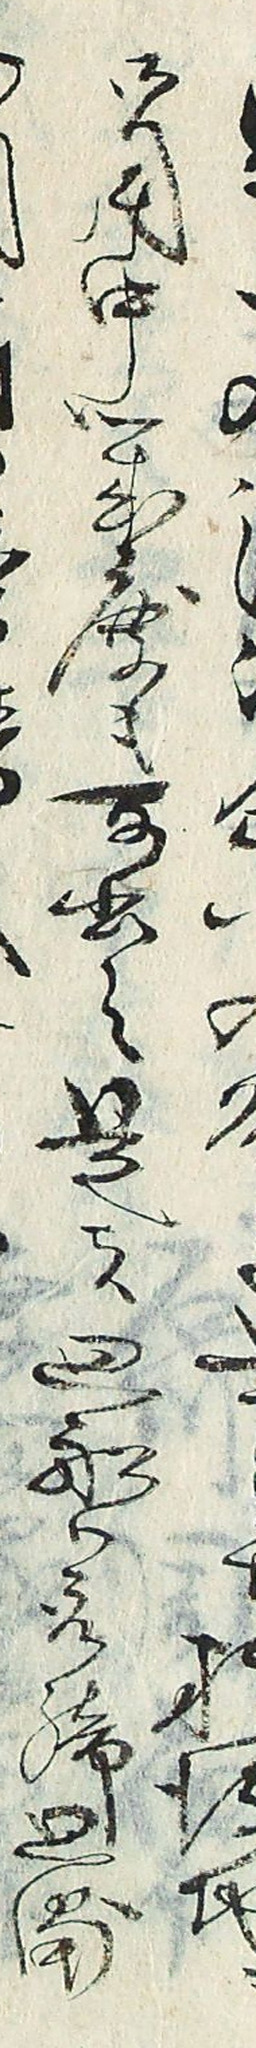御用中幾度も可出之是は廻船御取締廻浦
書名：公辺御役人為御廻浦御立越諸御用一巻
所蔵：鳴門教育大学 Naruto University of Education
